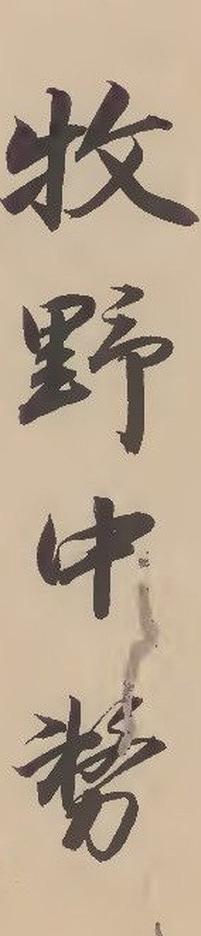牧野中務
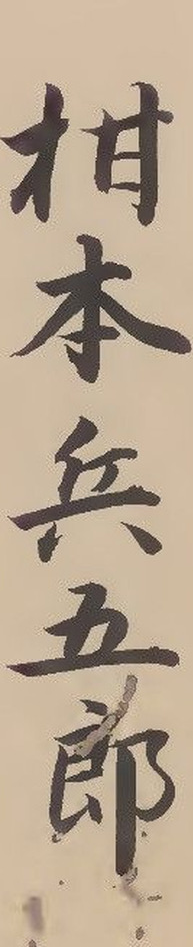柑本兵五郎
